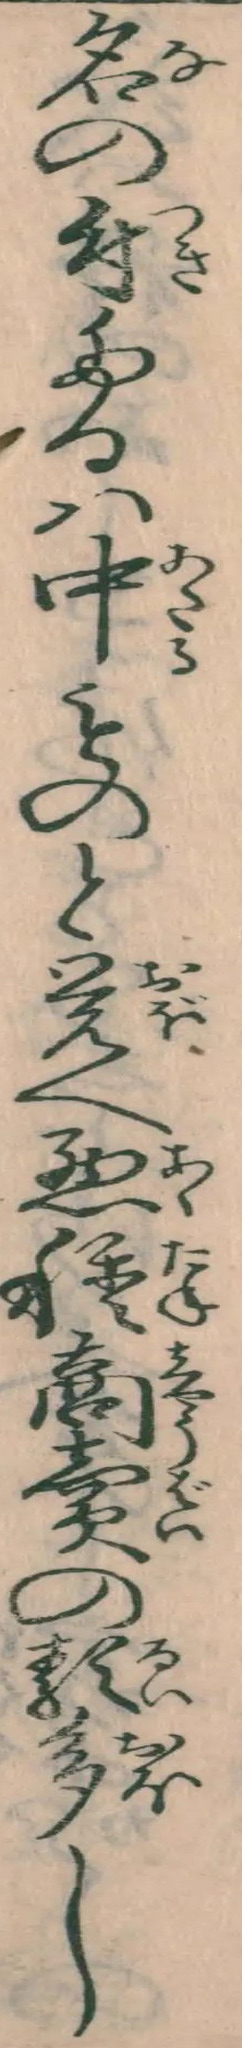名の付たるは中ものと覚へ悪種商売の類多し
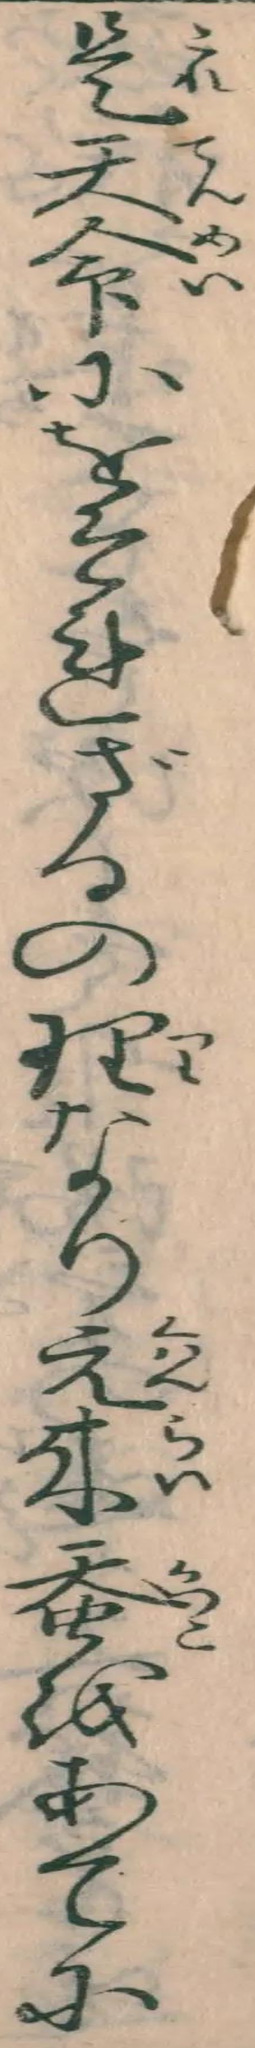是天命にをそれざるの理なり元来蚕をあてに
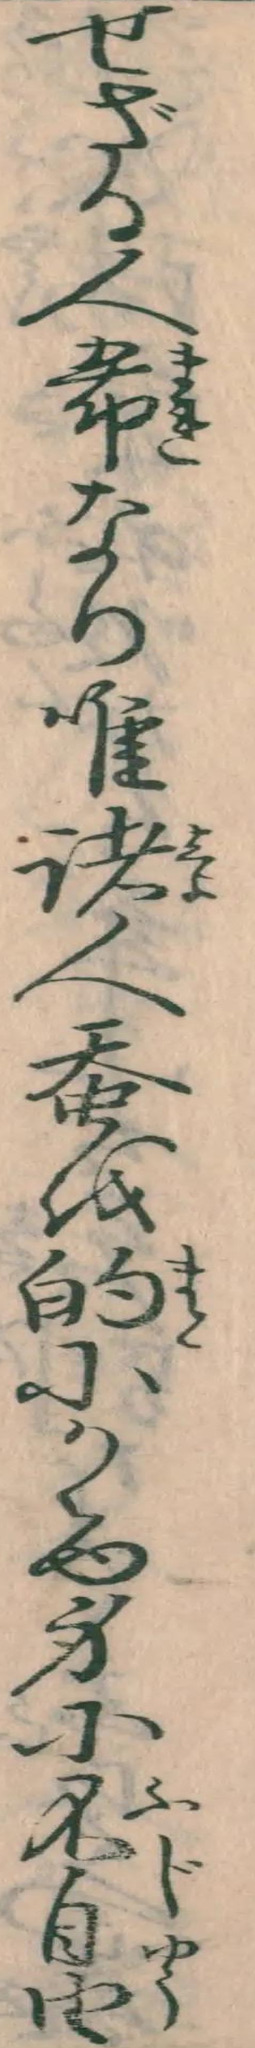せざる人希なり唯諸人蚕を的にかけ身に不自由
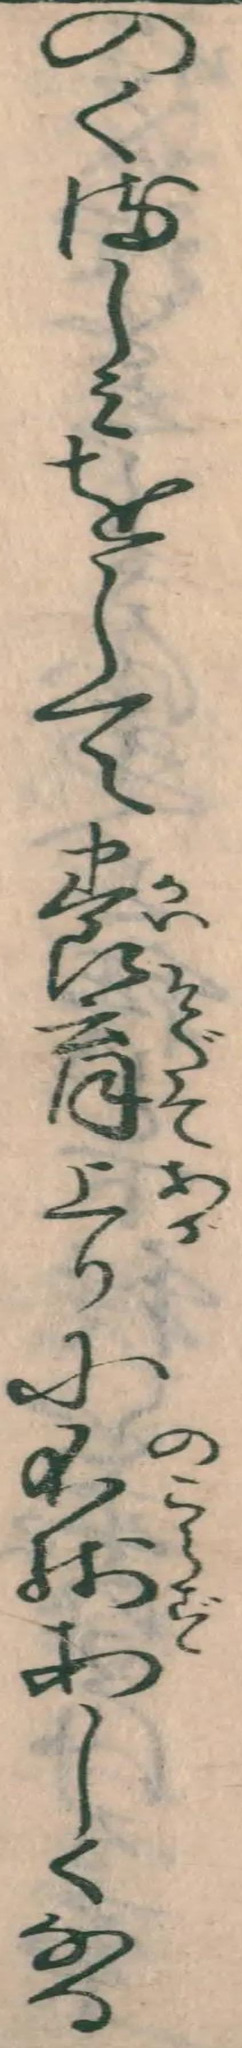のくるしみをして養育上りに不残あしくなる
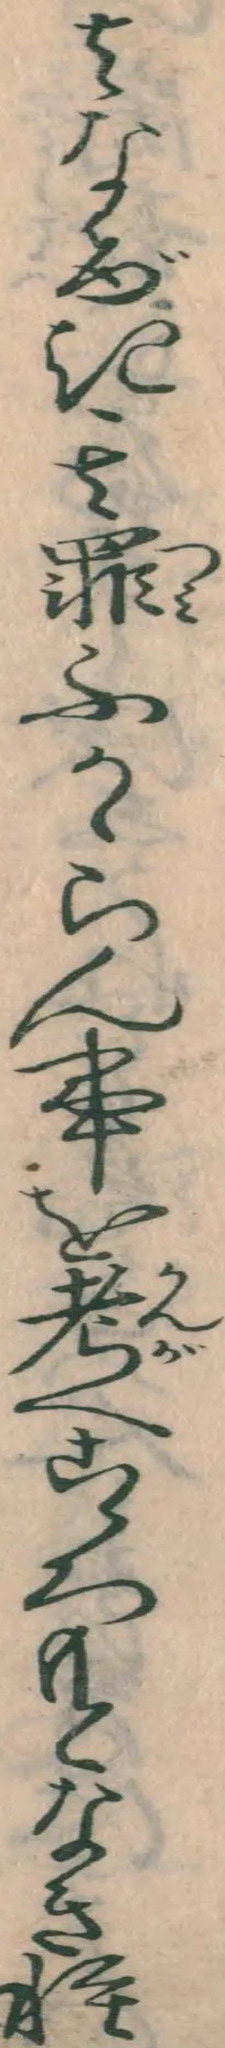其なげき其罪ふかゝらん事を考へこゝろもとなき種

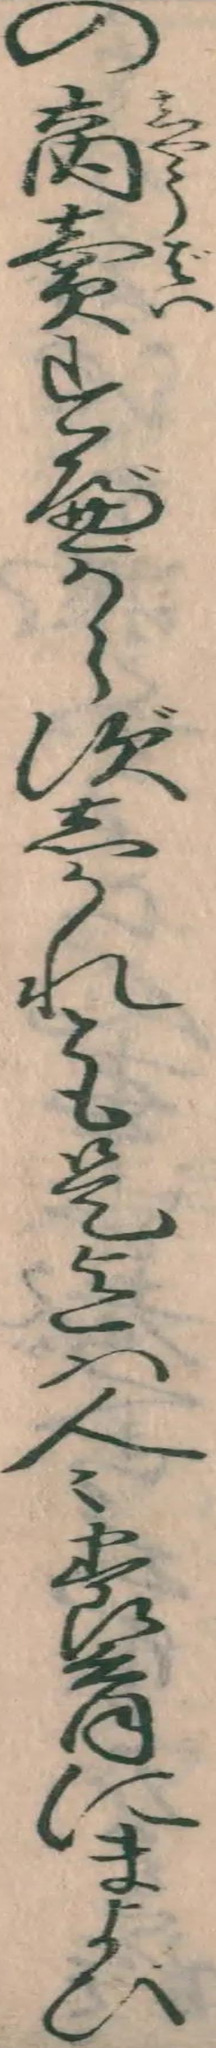の商売すべからずしかれとも是迄は人々養育にまよひ
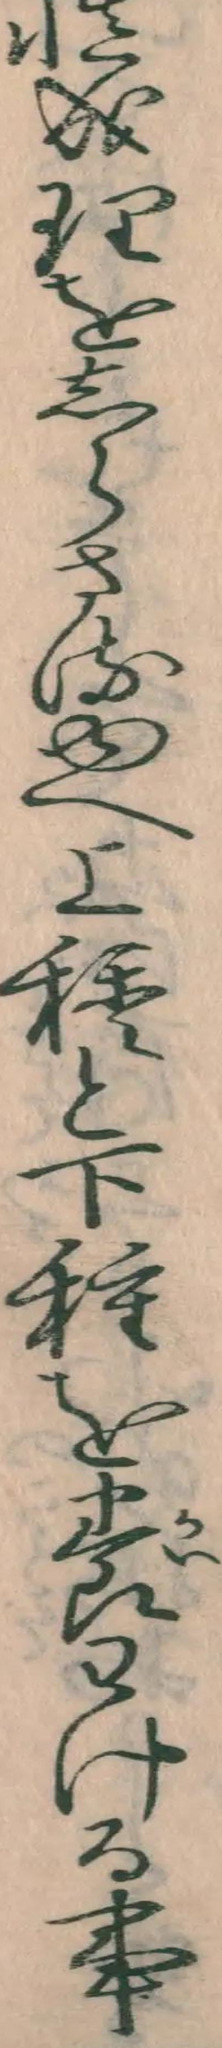慥成理をしらさるゆへ上種と下種を養わける事
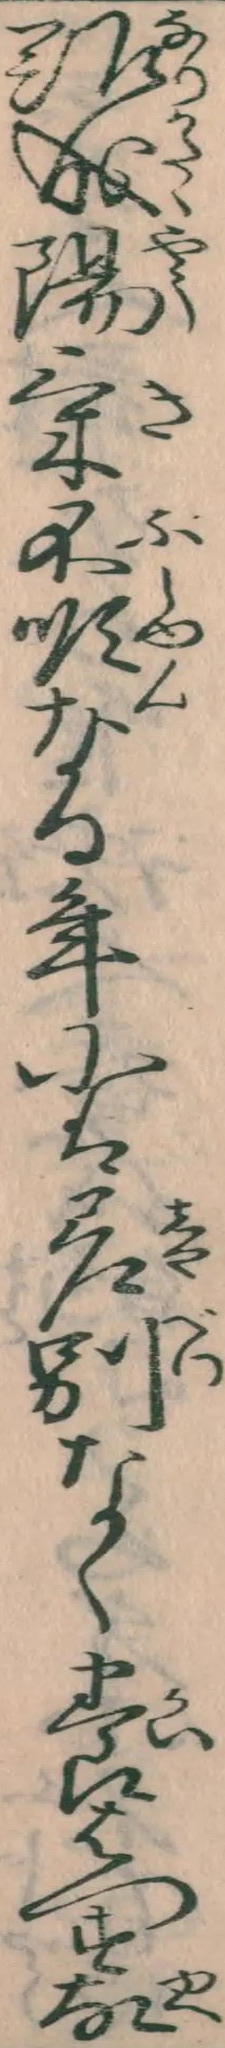難成陽気不順なる事には差別なく養はつす故
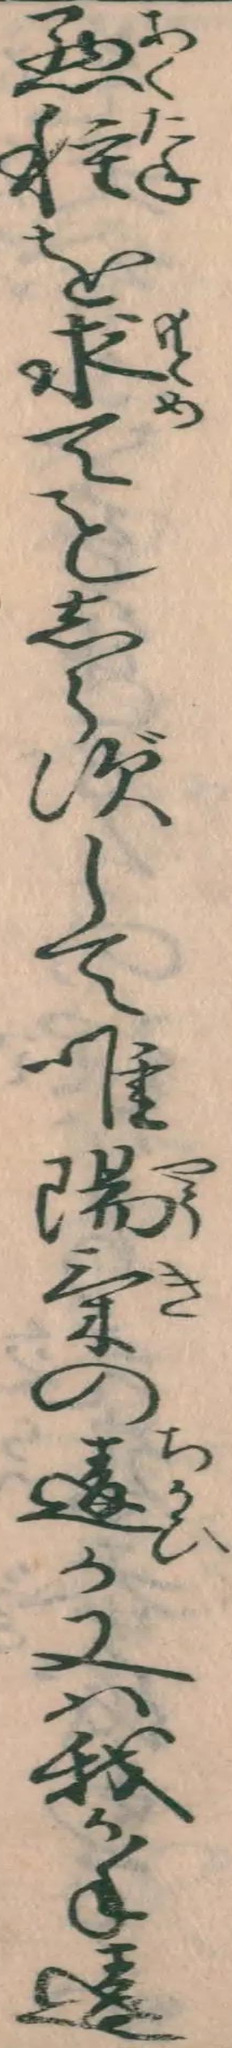悪種を求てもしらずして唯陽気の違か又は我か手違
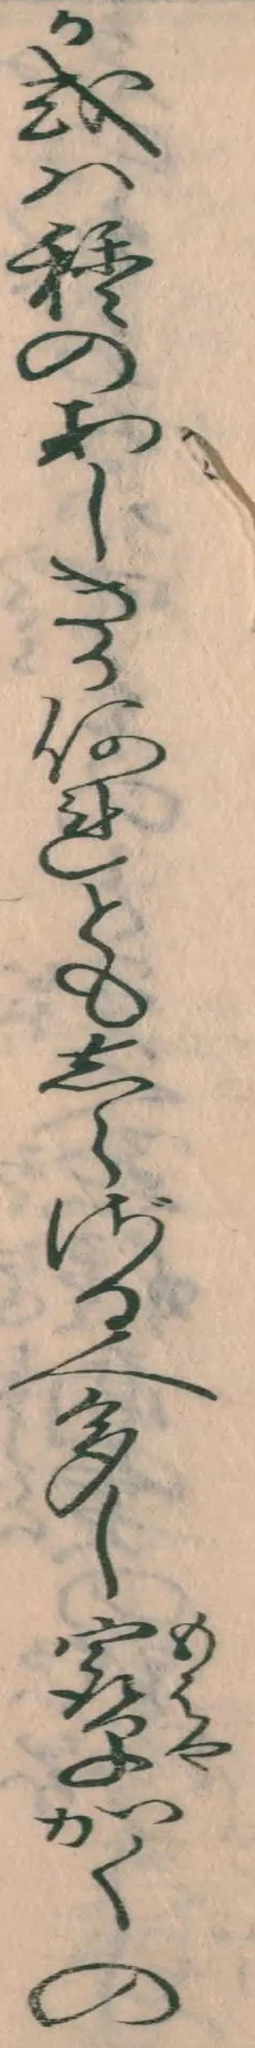か或は種のあしきか何れともしらざる人多し最早かくの
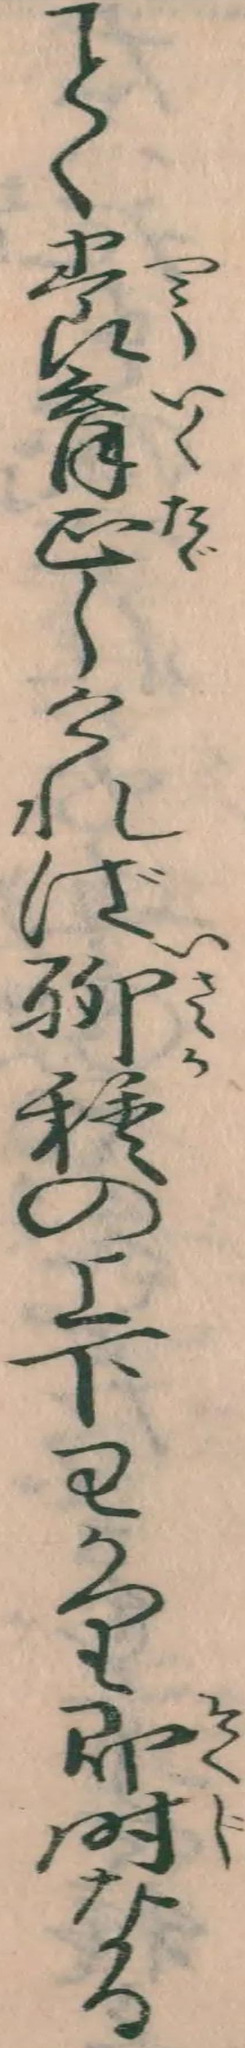ことく養育正しければ聊種の上下わかり即時なる
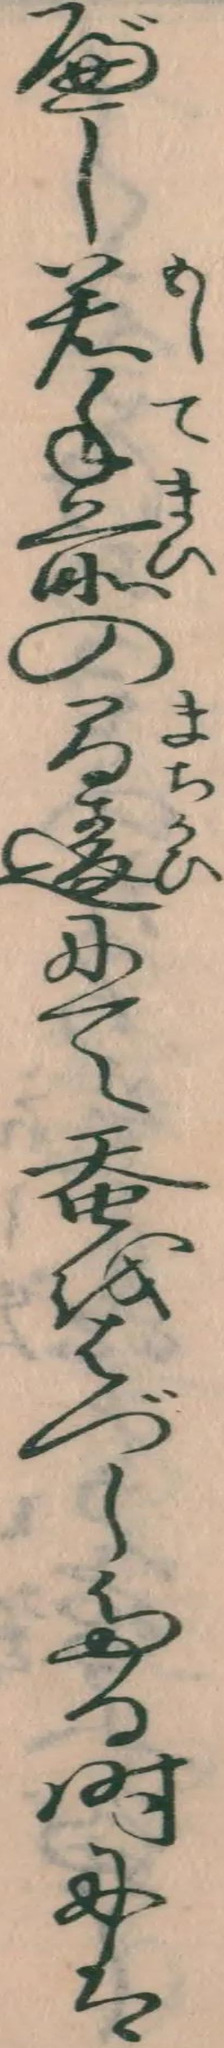べし若手前の間違にて蚕をはづしたる時には
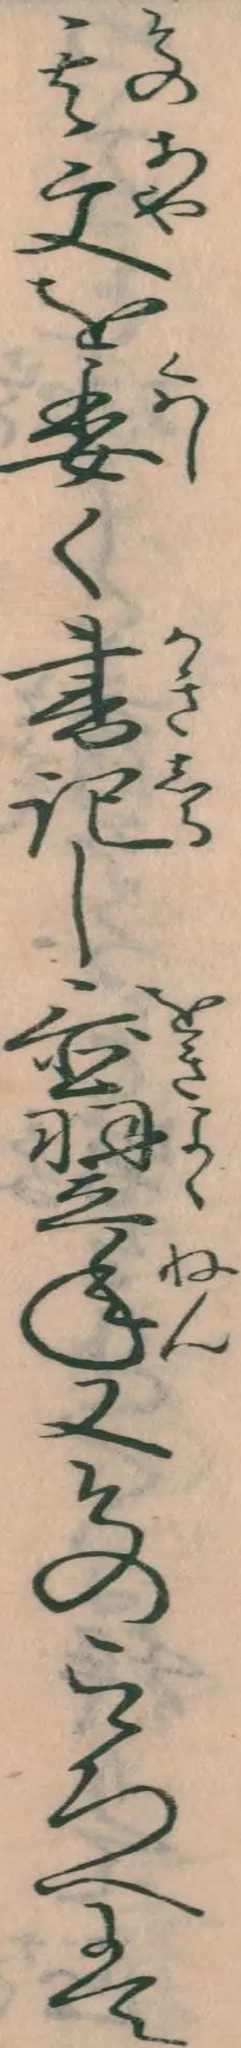其文を委く書記し置翌年又そのこゝろへにて
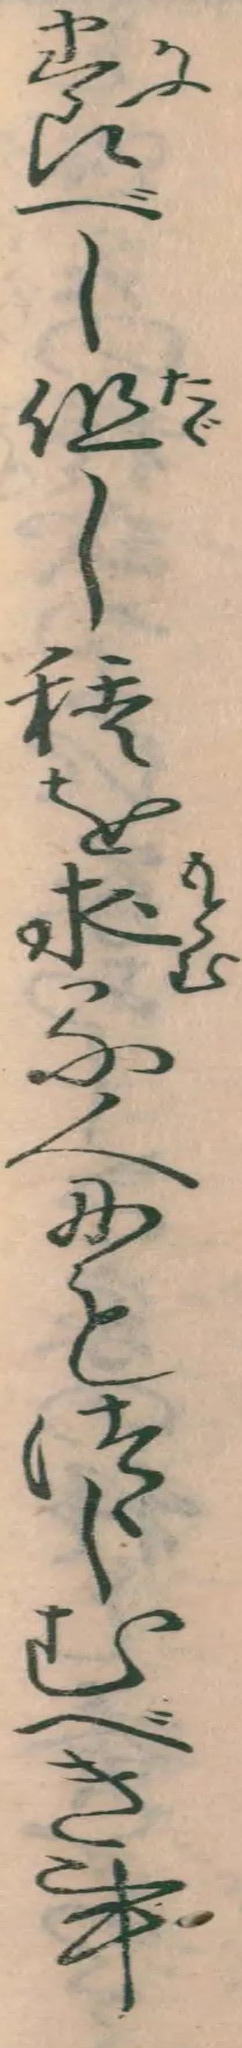養べし但し種を求る人にもつゝしむべき事
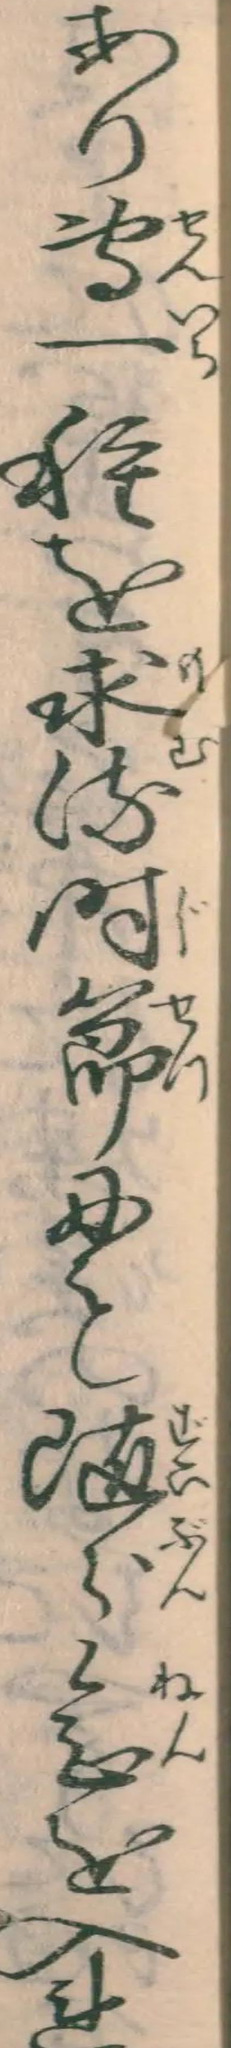あり専一種を求る時節にも随分念を入れ
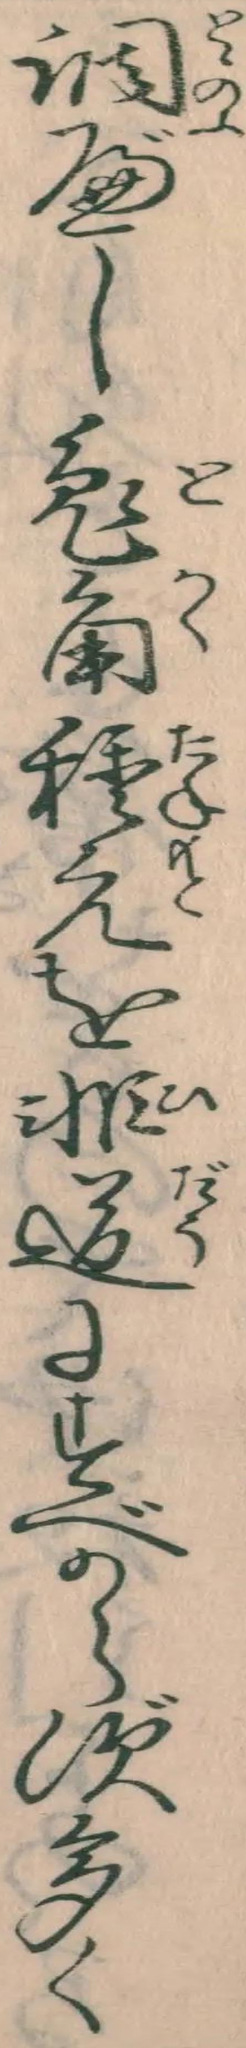調べし兎角種元を非道にすべからず多く
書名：新撰養蚕秘書
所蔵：国立国会図書館 National Diet Library, JAPAN
